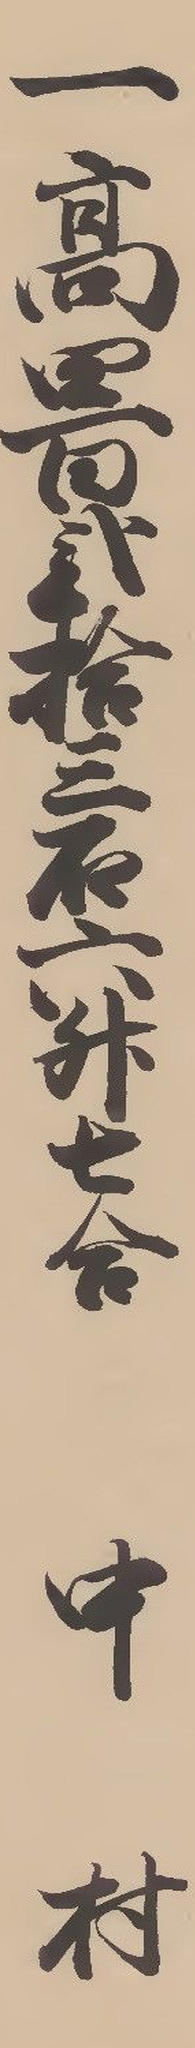一高四百弐拾三石六升七合中村
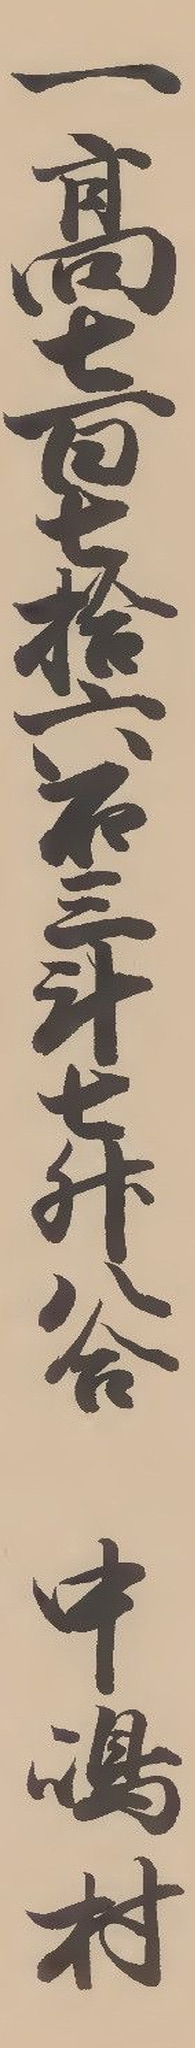一高七百七拾六石三斗七升八合中島村
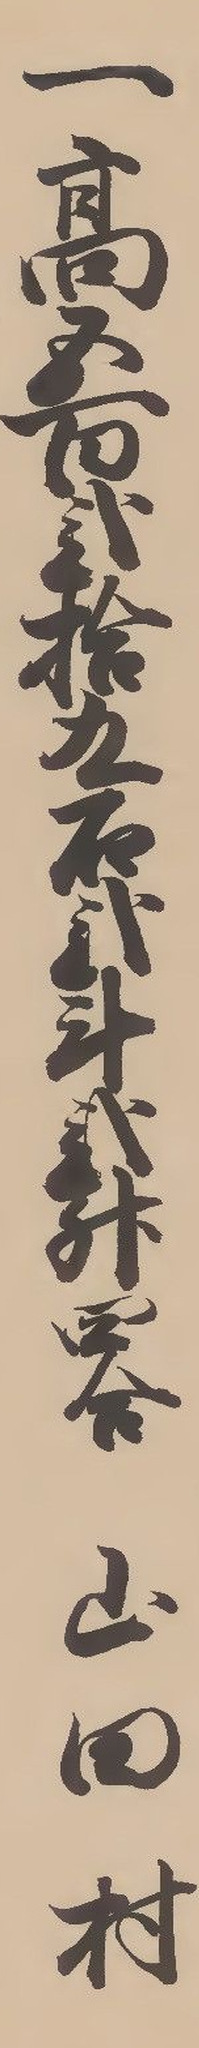一高五百弐拾九石弐斗弐升四合山田村
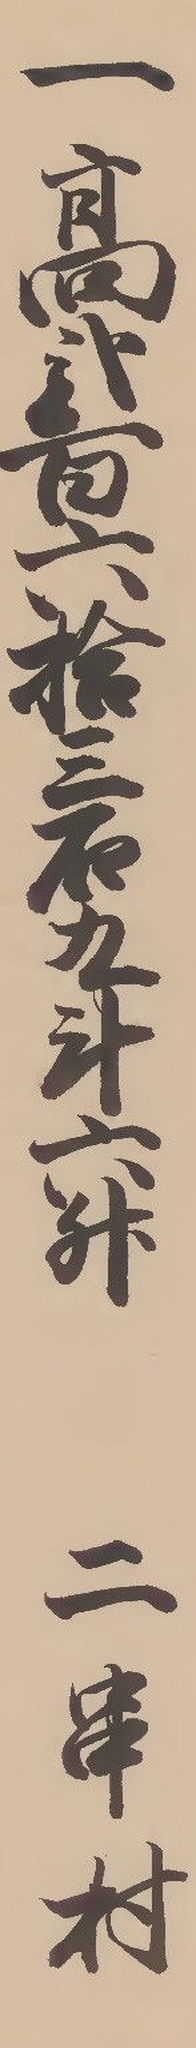一高弐百六拾三石九斗六升二串村

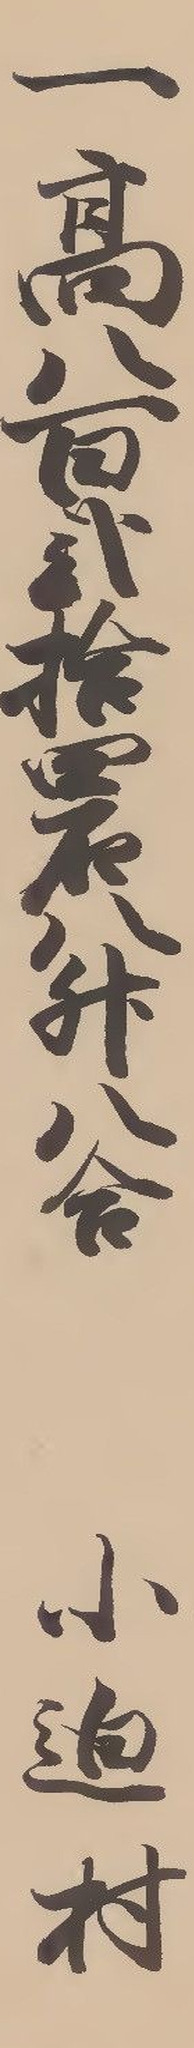一高八百弐拾四石八升八合小迫村
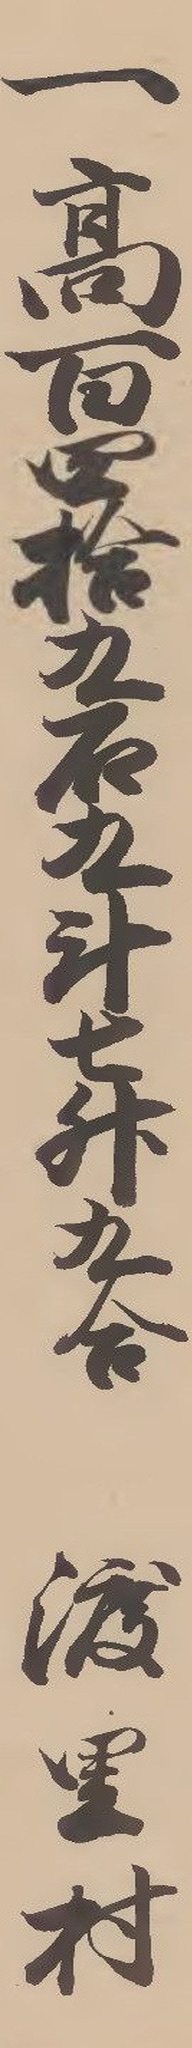一高百四拾九石九斗七升九合渡里村
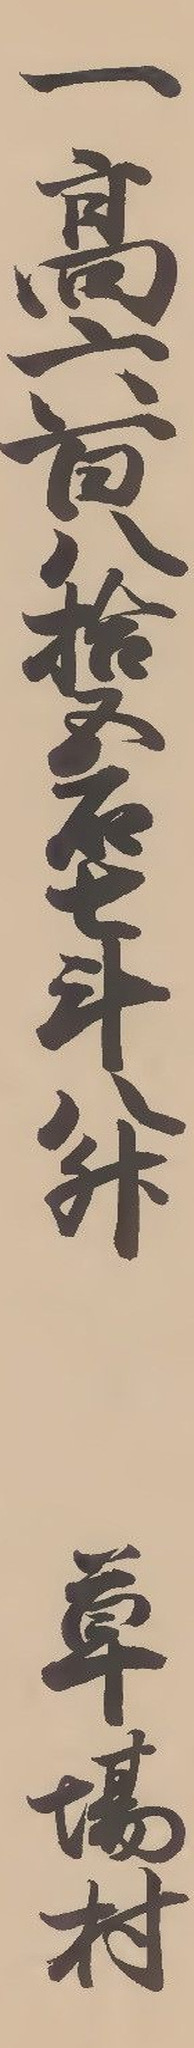一高六百八拾五石七斗八升草場村
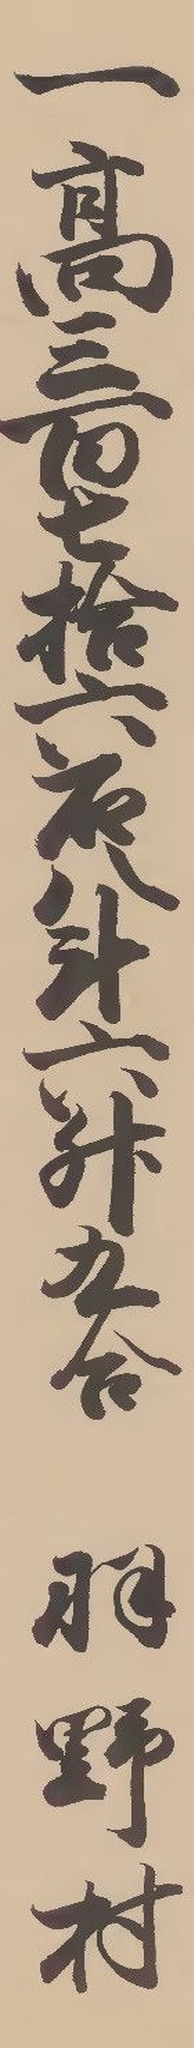一高三百七拾六石八斗六升九合羽野村
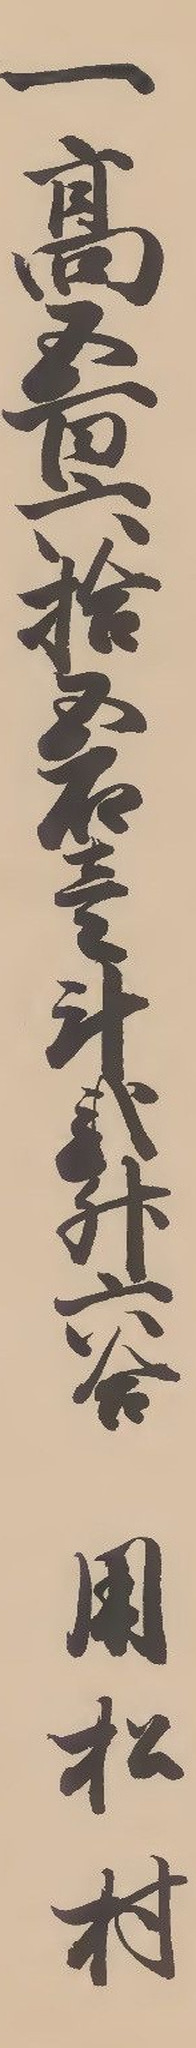一高五百六拾五石壱斗弐升六合用松村
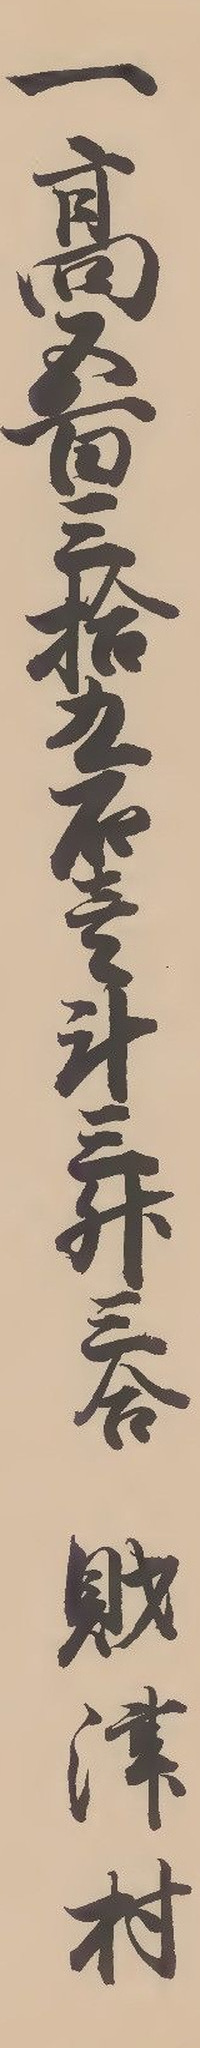一高五百三拾九石壱斗三升三合財津村
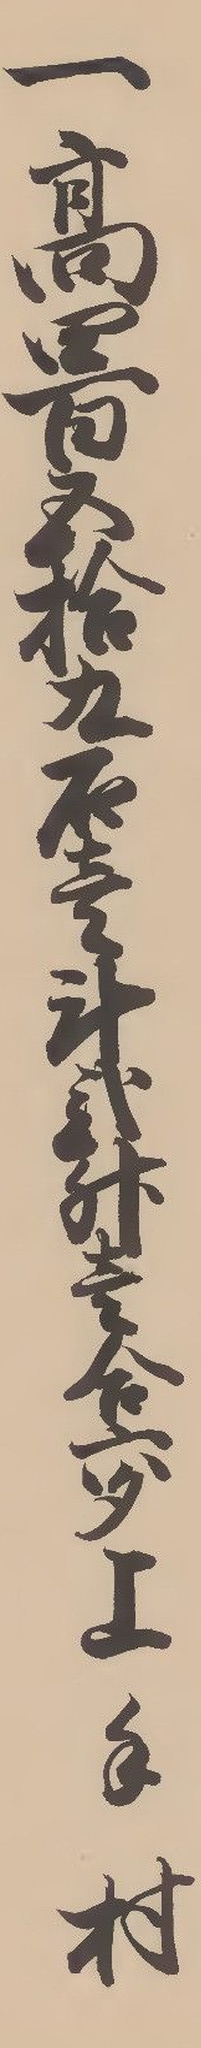一高四百五拾九石壱斗弐升壱合六勺上手村
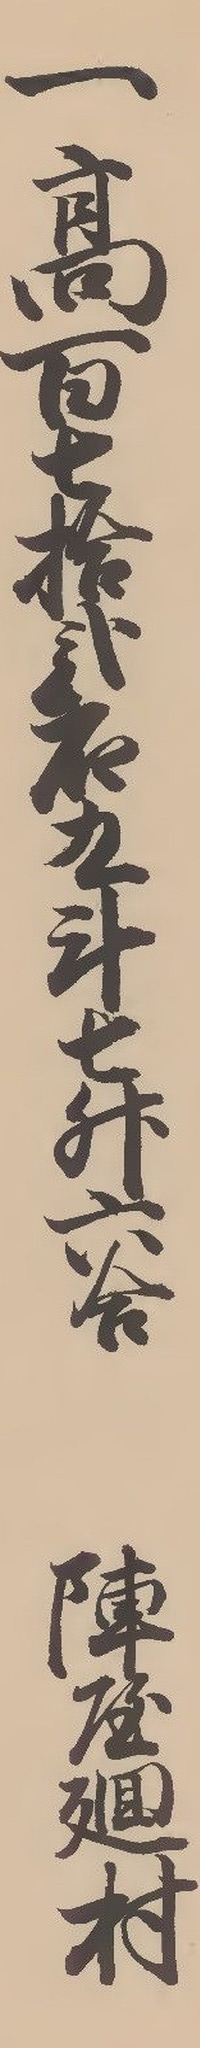一高百七拾弐石九斗七升六合陣屋廻村

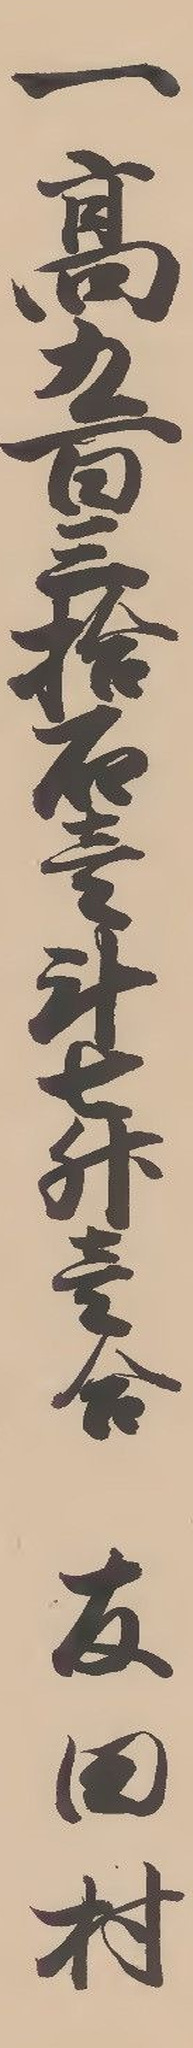一高九百三拾石壱斗七升壱合友田村
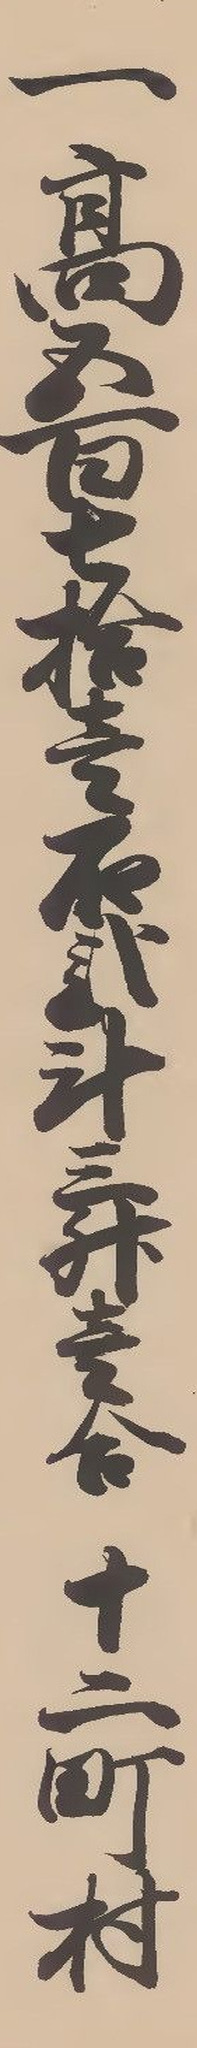一高五百七拾壱石弐斗三升壱合十二町村
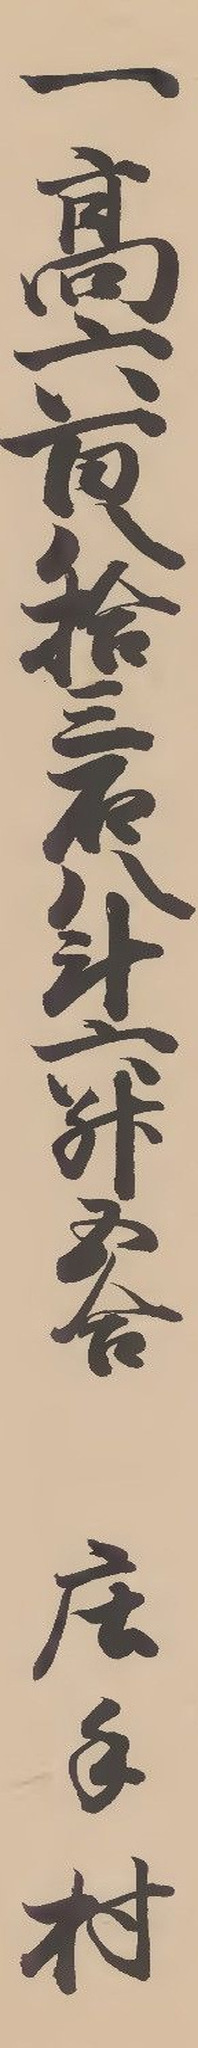一高六百八拾三石八斗六升五合庄手村
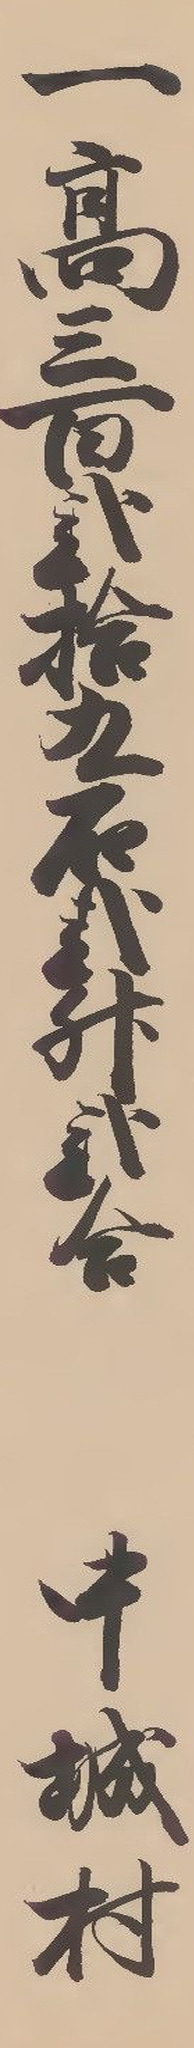一高三百弐拾九石弐升弐合中城村
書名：豊後国郷帳
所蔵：国立公文書館 National Archives of Japan
